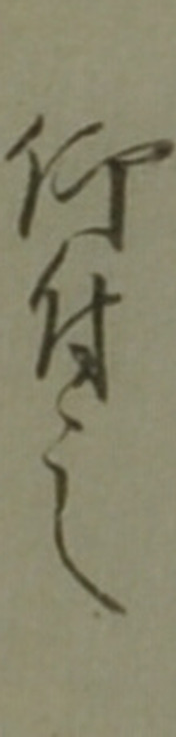仰付之
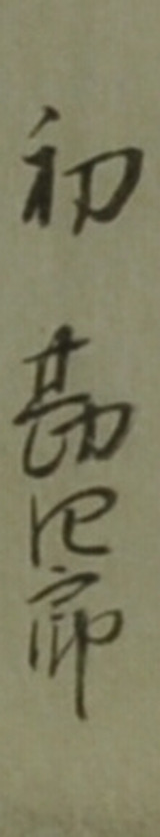初勘四郎
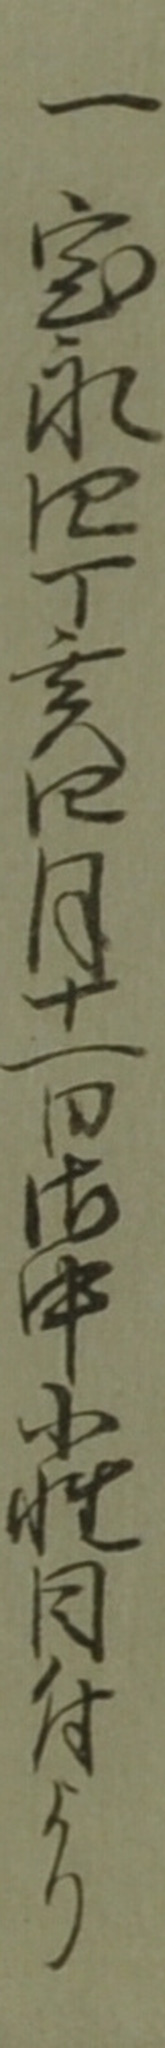一宝永四丁亥四月十一日御中小性目付より
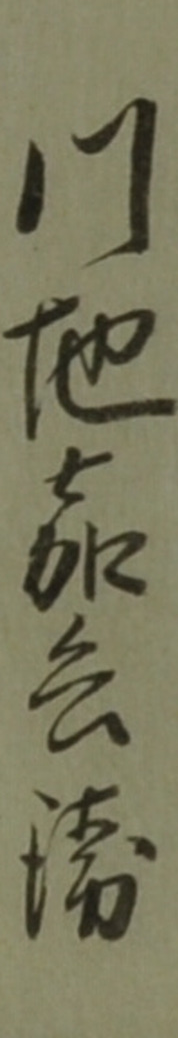川地嘉兵衛
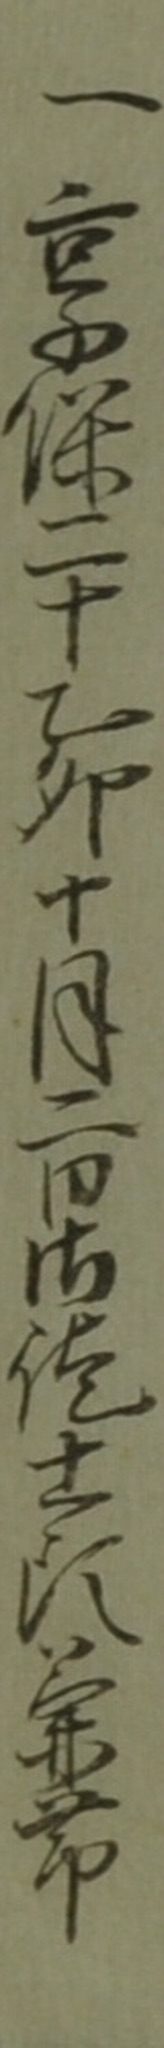一享保二十乙卯十月二日御徒士頭兼帯
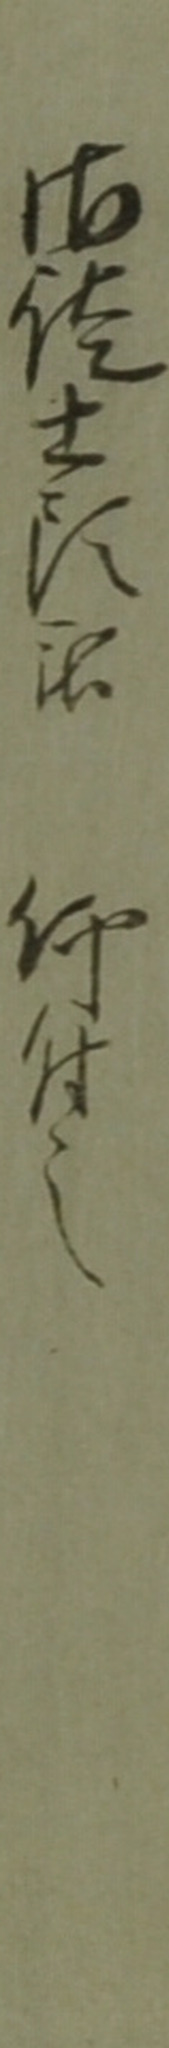御徒士頭被仰付之
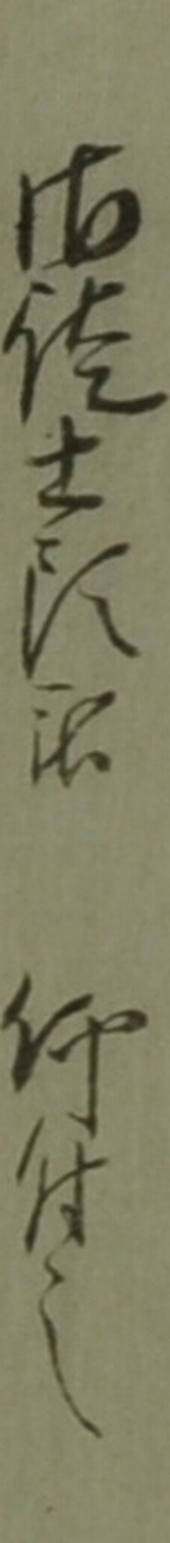御徒士頭被仰付之
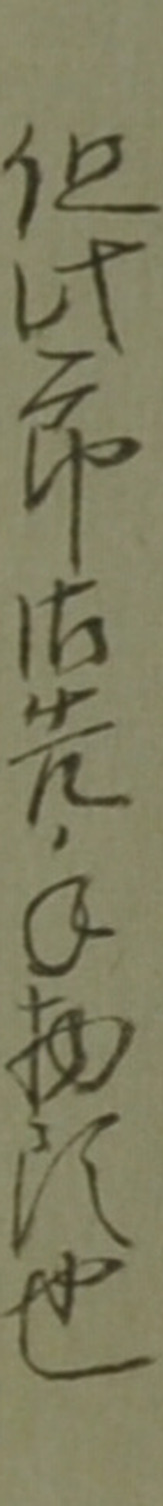但此節御先手物頭也

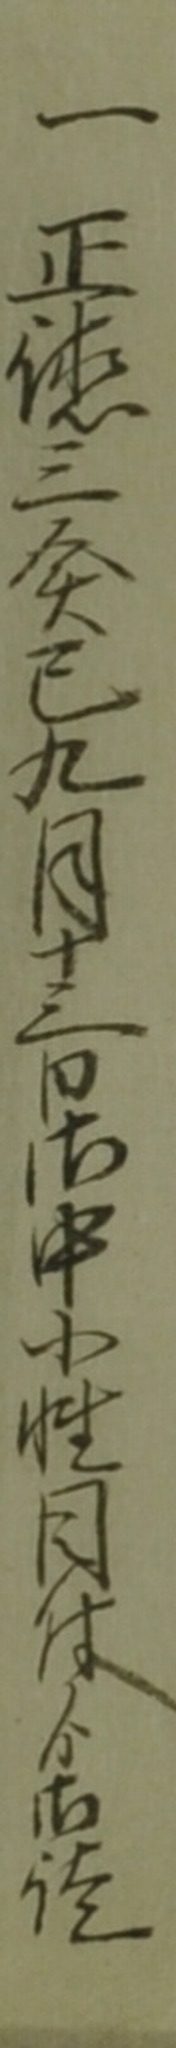一正徳三癸巳九月十三日御中小性目付ゟ御徒
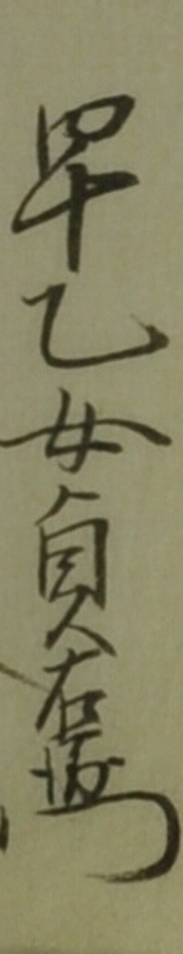早乙女貞右衛門
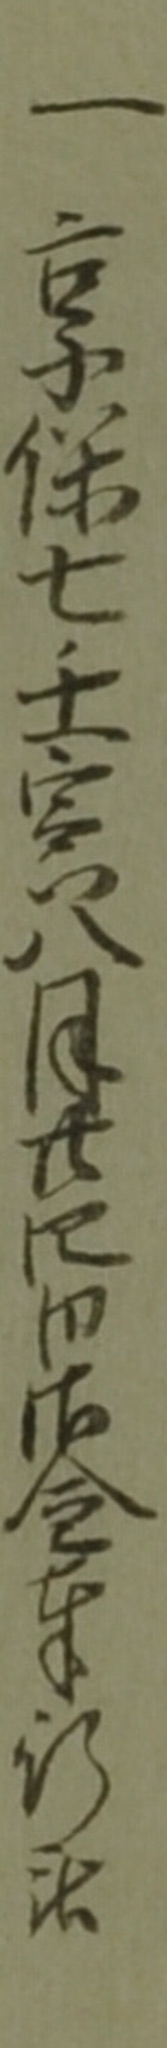一享保七壬寅八月廿四日御金奉行被
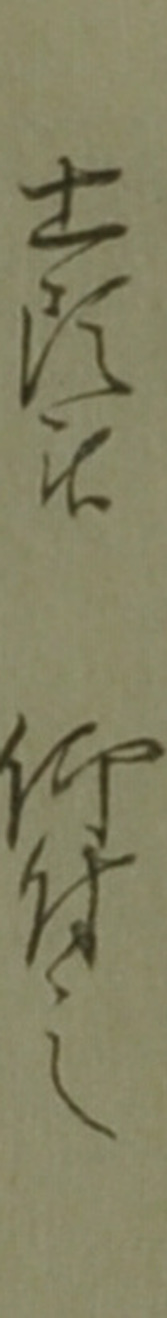士頭被仰付之
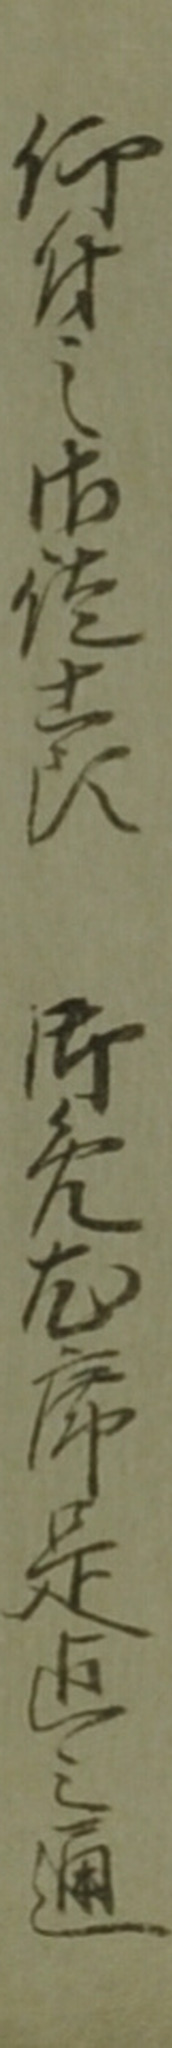仰付之御徒士頭御免尤席是迄之通
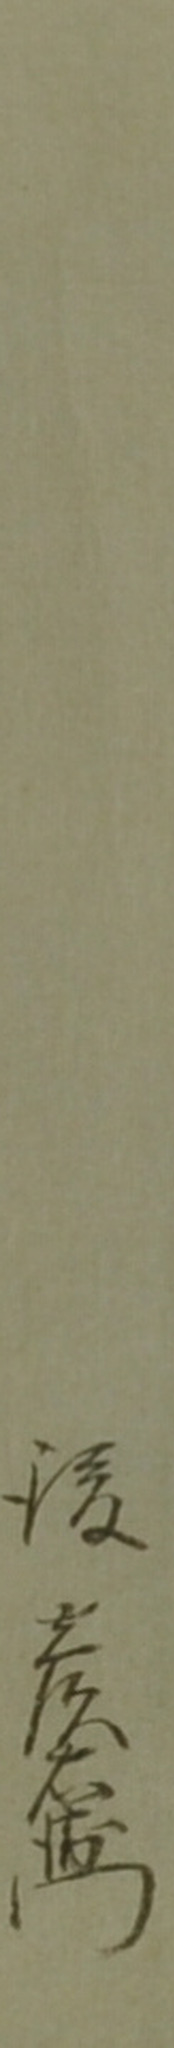後彦右衛門
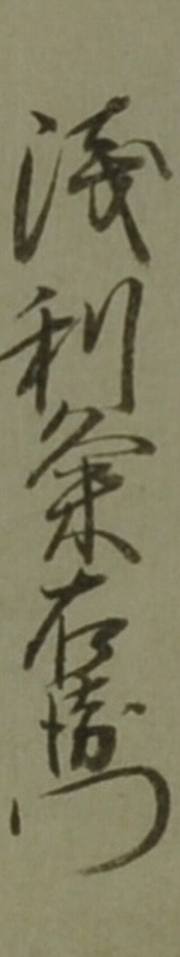浅利粂右衛門
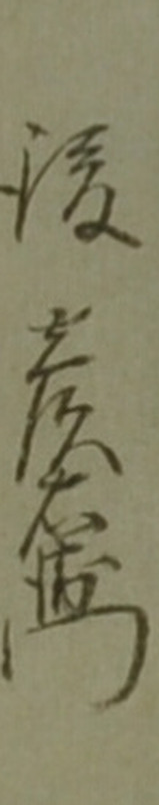後彦右衛門
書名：諸御役代々録（六）
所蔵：伊那市立高遠町図書館・合同会社AMANE
